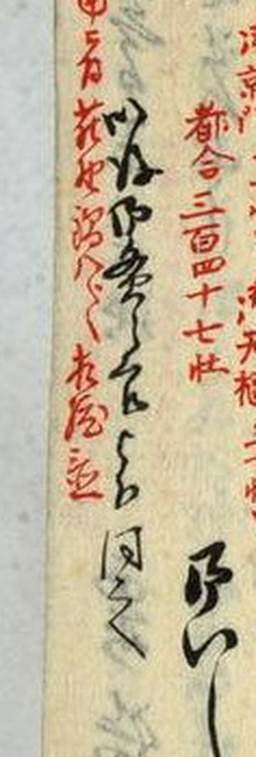以後御灸之節被下之同之

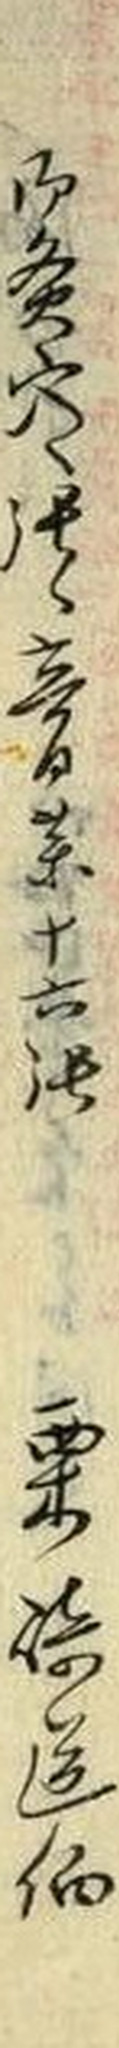御灸穴へ張候膏薬十六張栗崎道伯
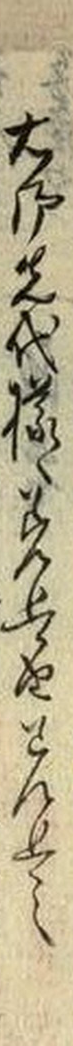右御先代様へ差上候由差上之
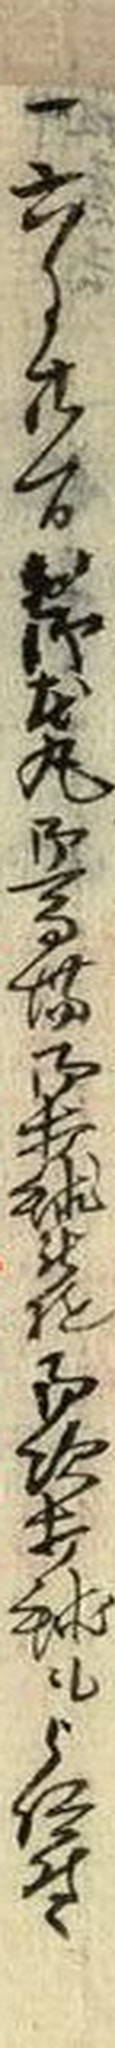一六月廿一日於御本丸御馬場御打毬被遊御次打毬も被仰付候
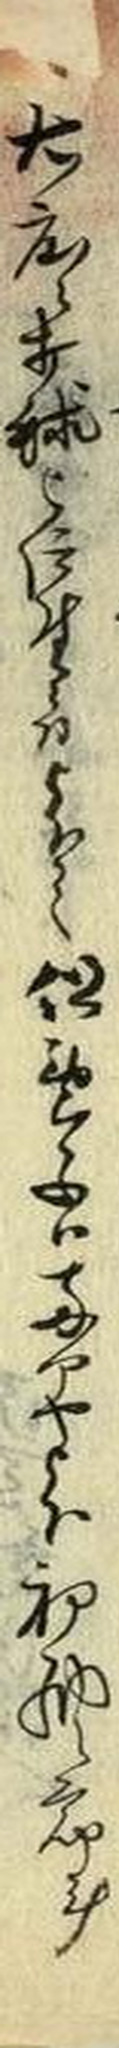右度々打毬被仰付候ニ付被下之但台子ハ両部や被下初納之節斗
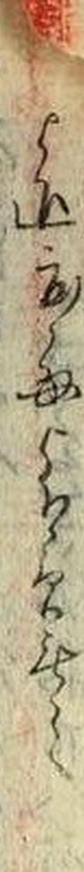被下」度々毎被下候而ハ無之
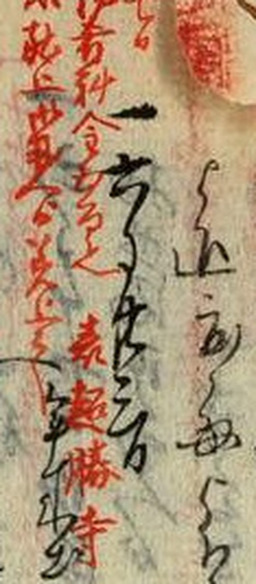一六月廿三日
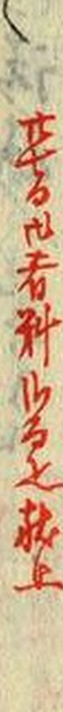廿七日御肴料弐百疋献上
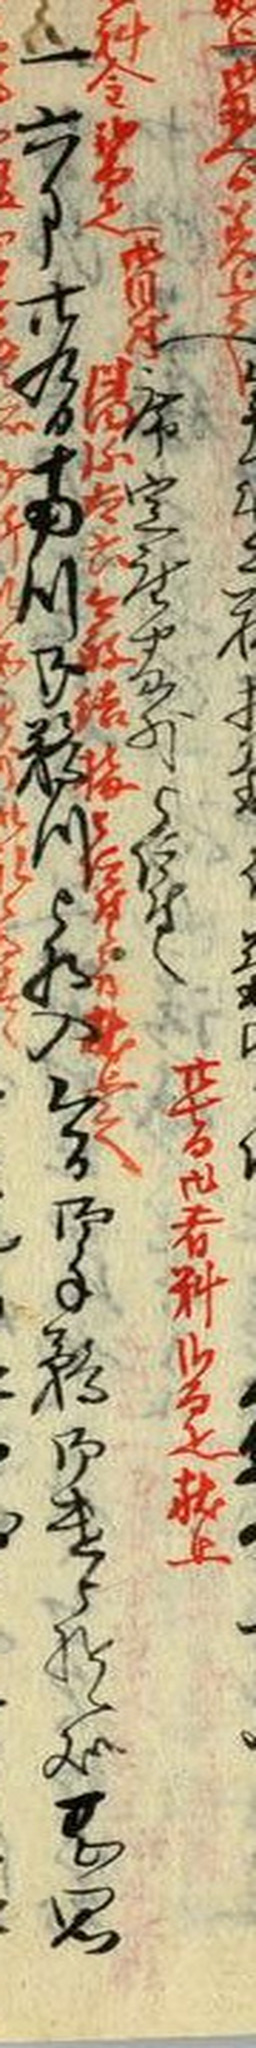一六月廿九日南川御鵜川被為入今日御手鵜御遣候処甚思
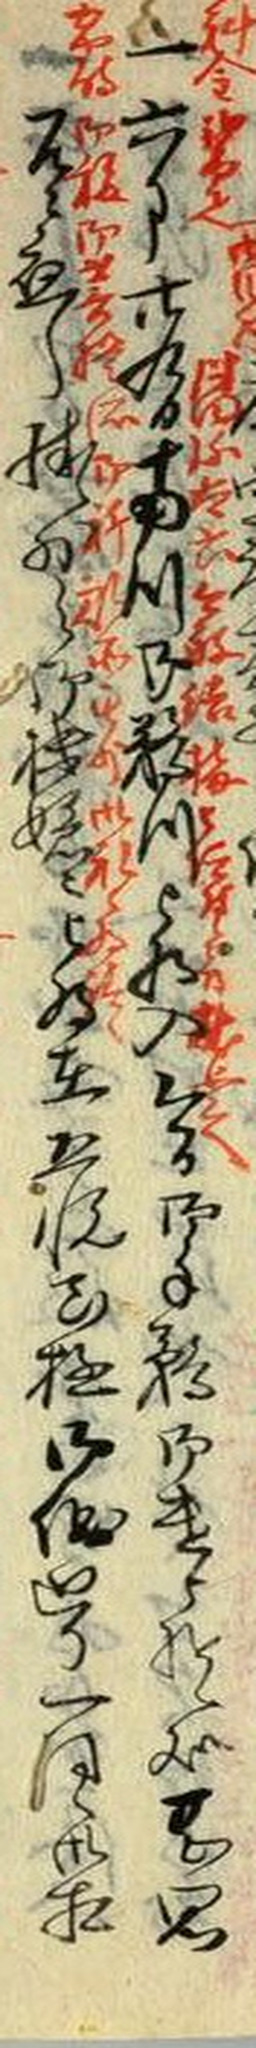召ニ応し殊之外之御機嫌ニ被為在恐悦至極御側廻り一同御相
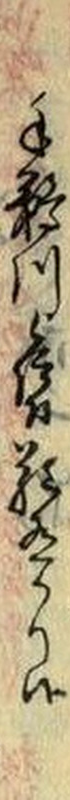手鵜川被仰付難有かり候
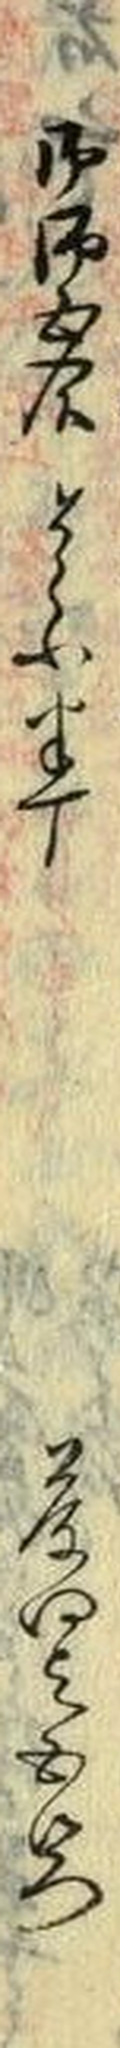御酒五合とうふ半丁藤田与五右衛門
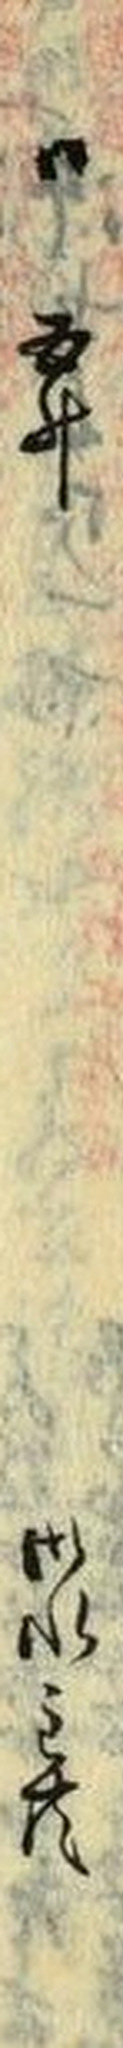同五升御水主共
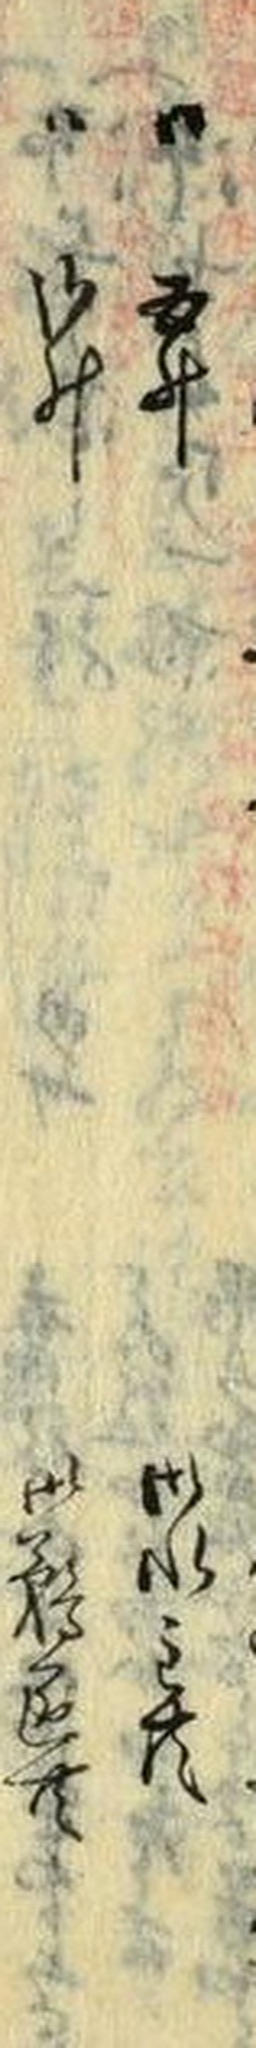同弐升御鵜匠共
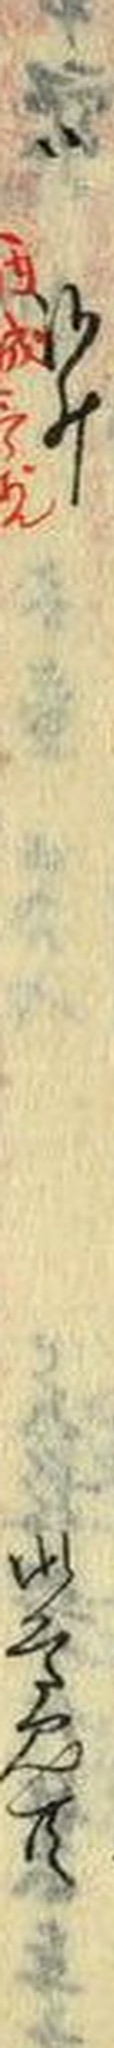同弐升御鳥見共
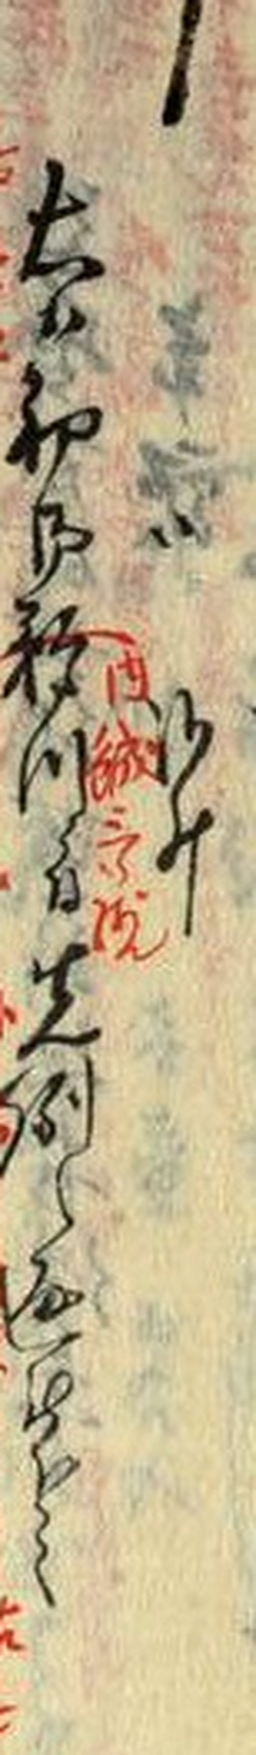右ハ初御鵜川ニ付先例之通被下之
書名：少傅日録抄（斉承付側向頭取日記、在国）
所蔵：福井県文書館 Fukui Prefectural Archives
